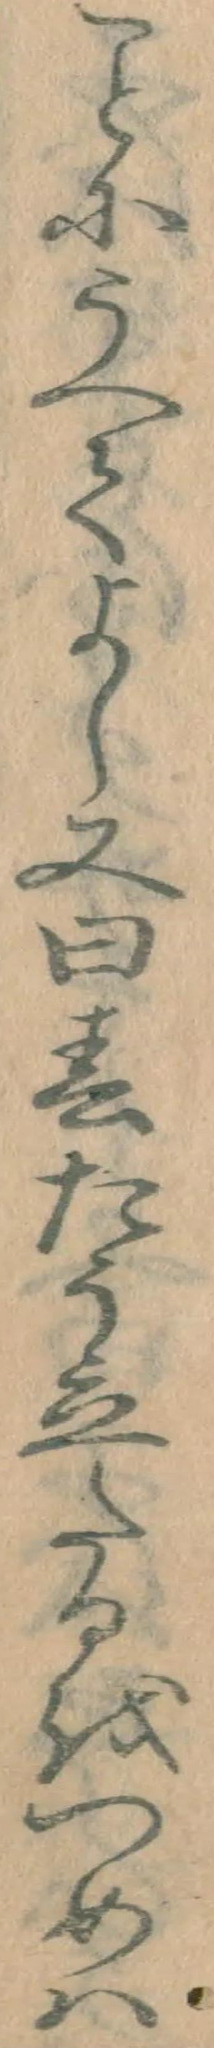ことにうへてよし又曰春たう立たるをつめは

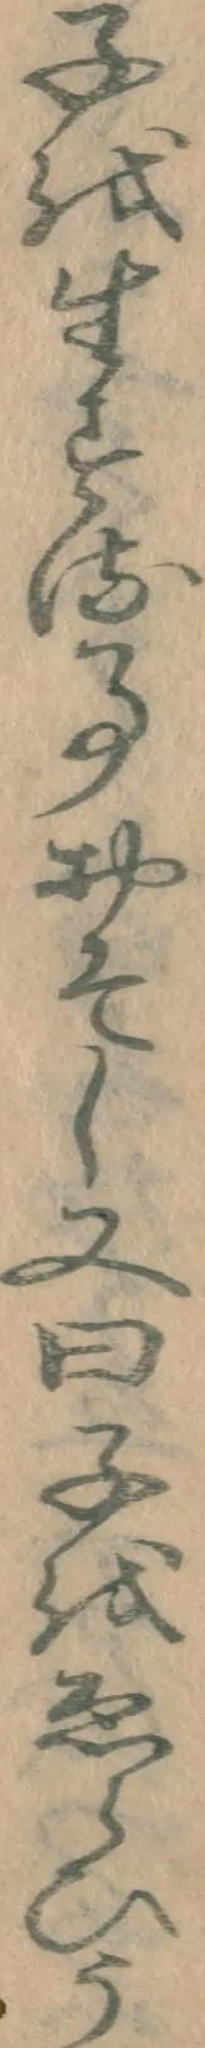子を生する事おそし又日子をゑらひう
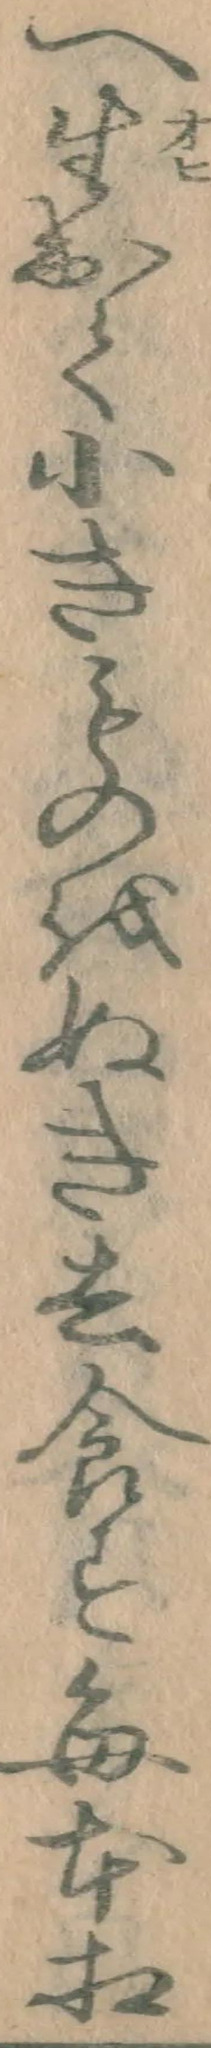へ生出て小きものをぬき去食す毎本相
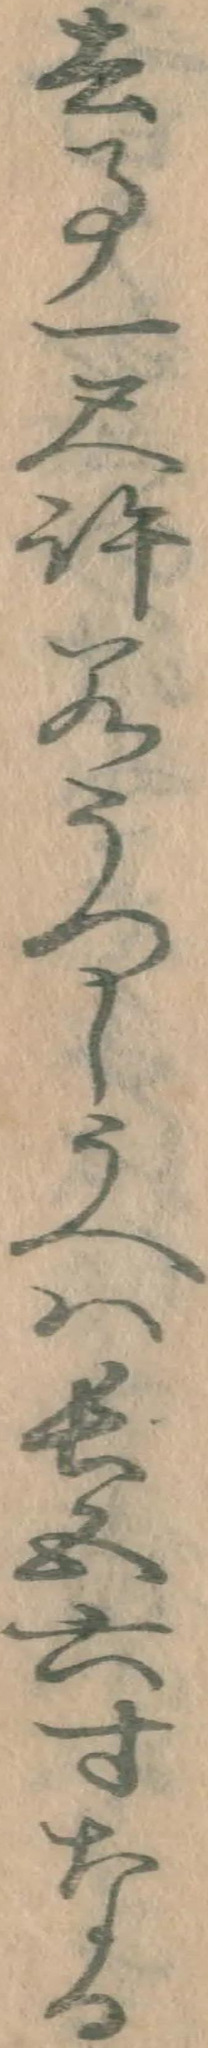去事一尺許若うつしうへは長五六寸なる
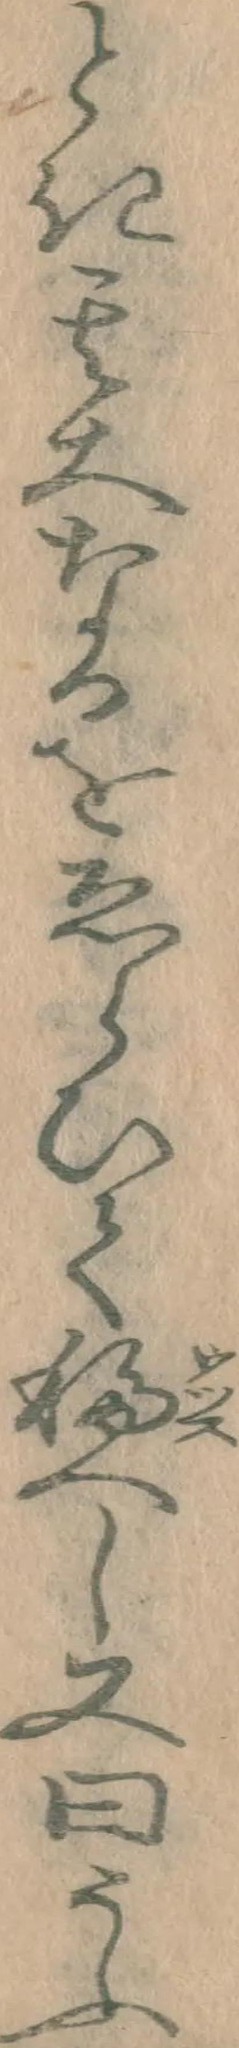とき其大なるをゑらひて移へし又曰うふ
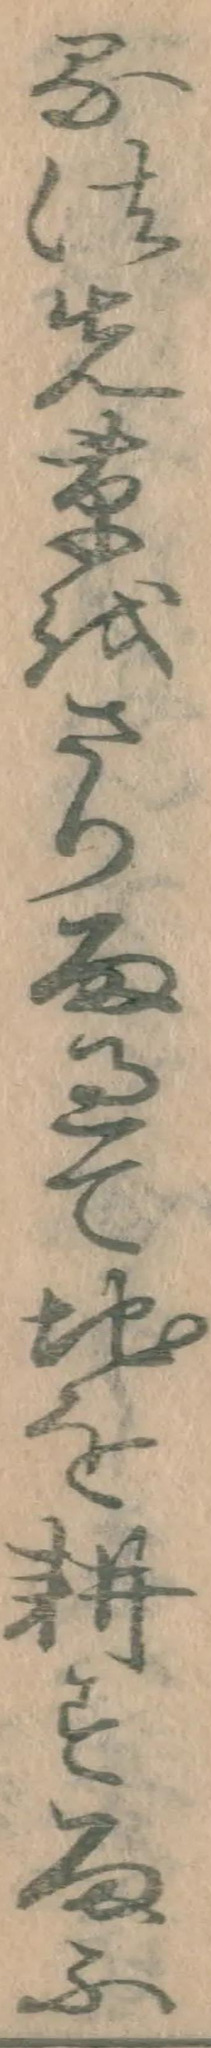る法先草をさり雨過て地を耕す雨ふ
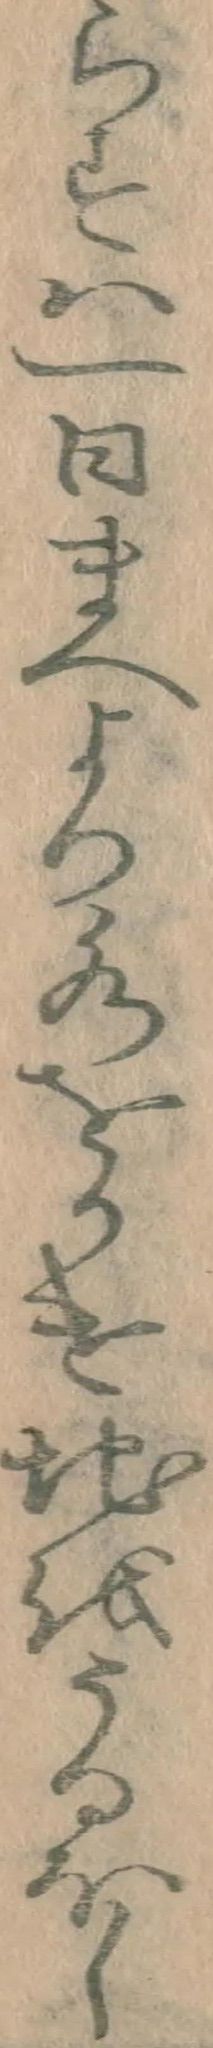らすは一日まへより水をかけ地をうるほし
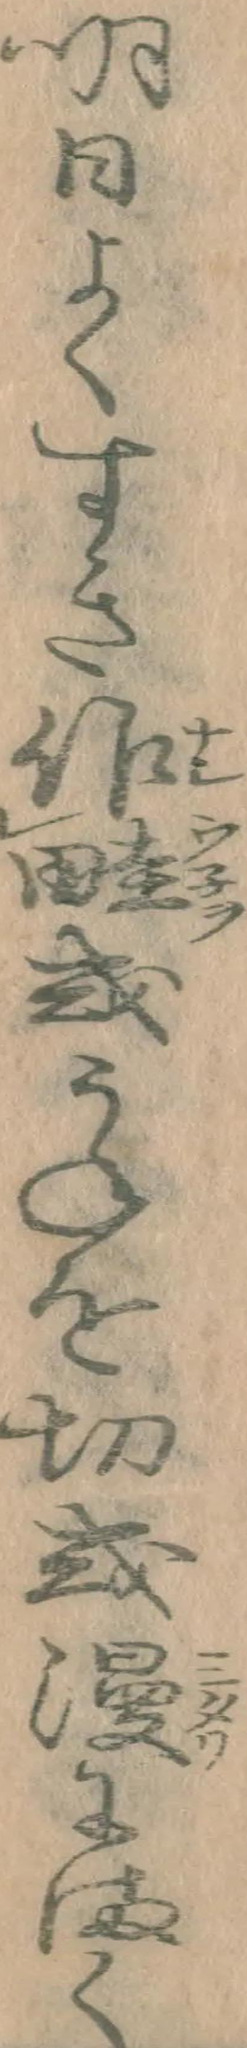明日よくすき作畦或うねを切或漫にまく
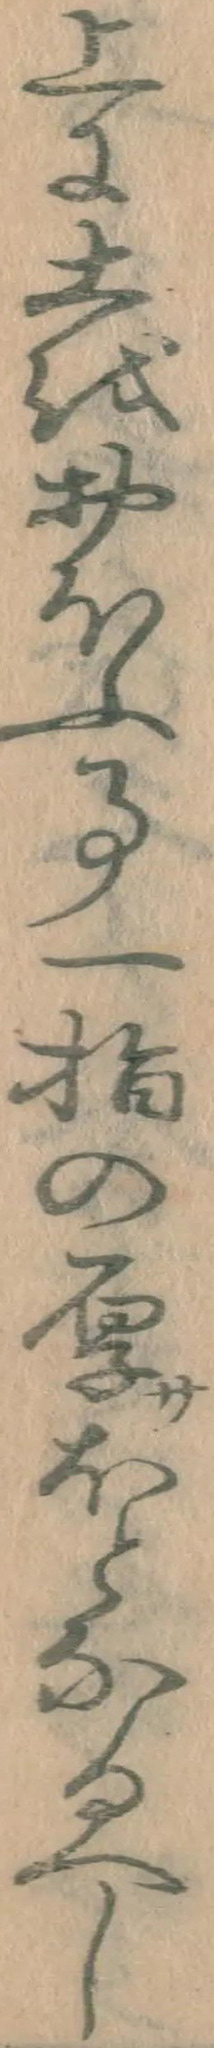上に土をおほふ事一指の厚ほとなるへし
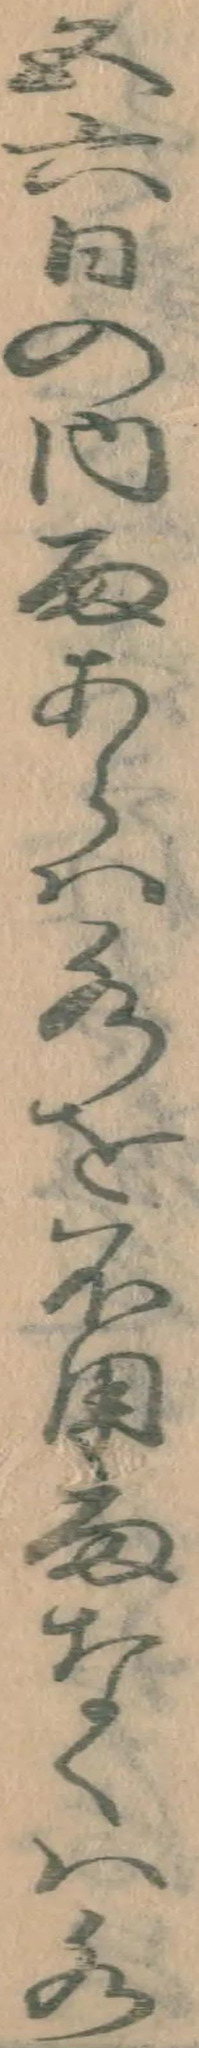五六日の内雨あらは水を不用雨なくは水
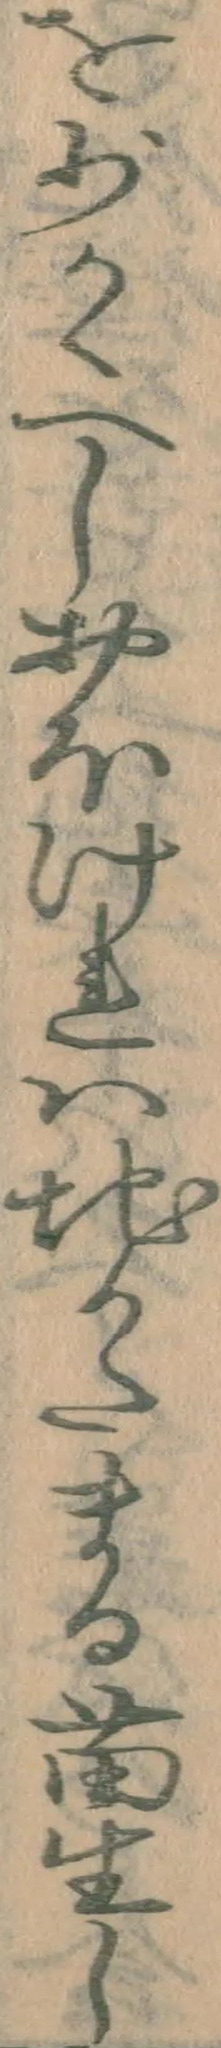を少かくへしおほけれは地かたまる苗生し
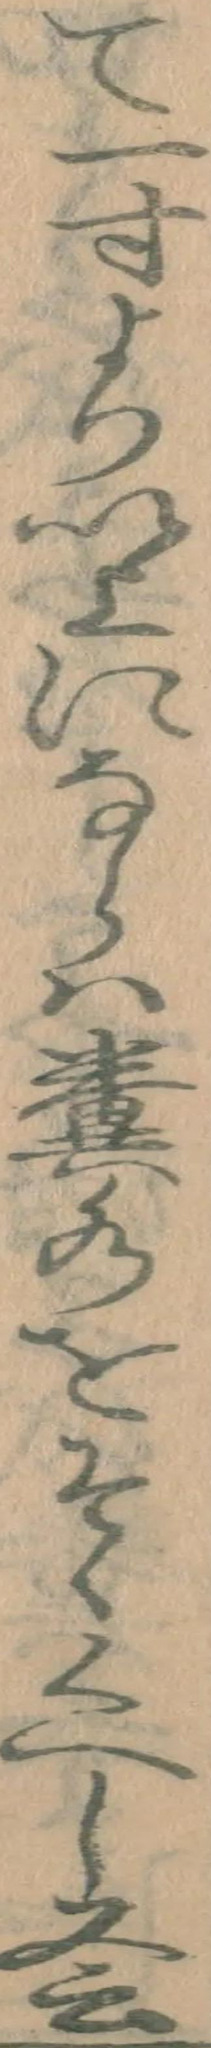て一寸より以上にならは糞水をそゝくへし又云
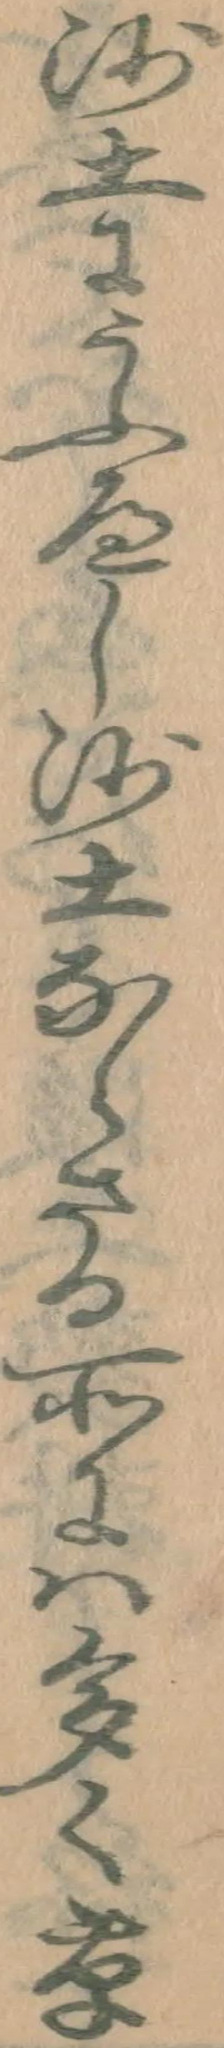沙土にうふへし沙土ならさる所には多く草
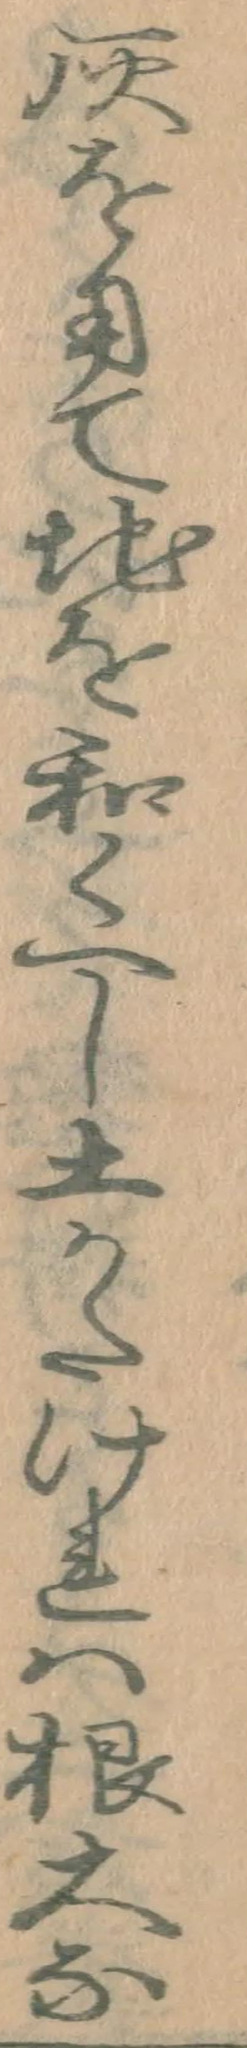灰を用て地を和くへし土かたけれは根大な
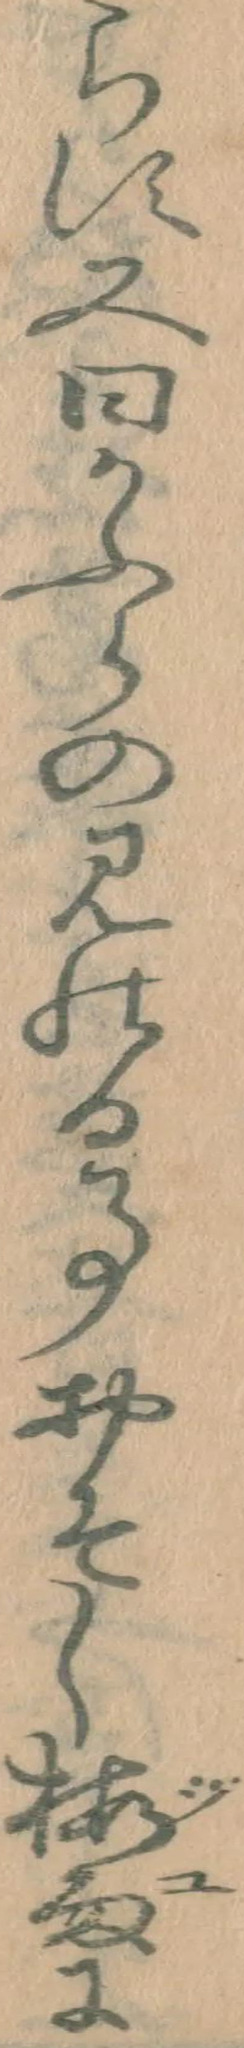らす又曰かふらのみのる事おそし梅雨に
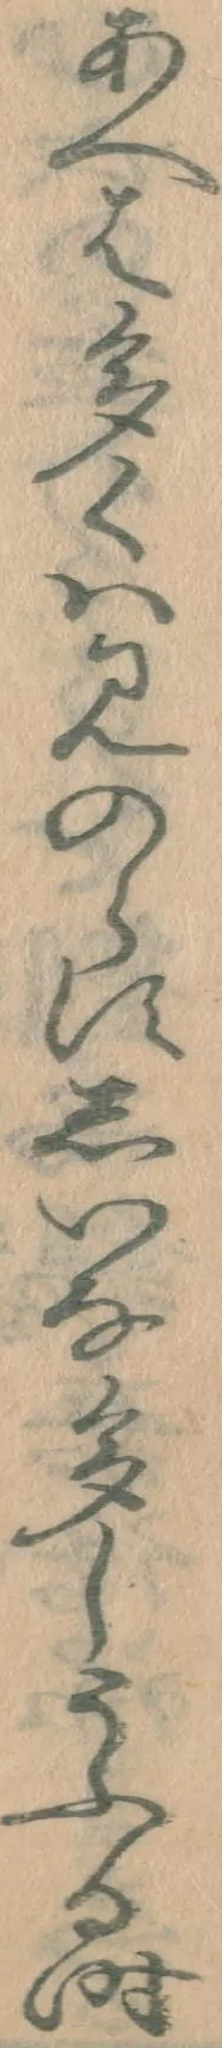あへは多くはみのらすしいな多しうふる時
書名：菜譜 3巻
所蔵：国立国会図書館 National Diet Library, JAPAN
